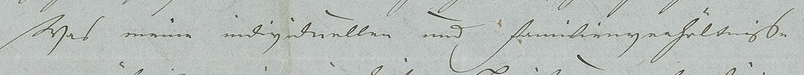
Was meine individuellen und Familienverhältnisse
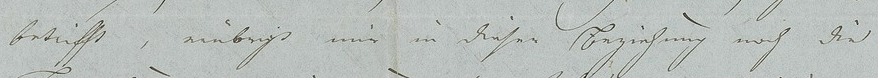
betrifft, erübrigt mir in dieser Beziehung noch die
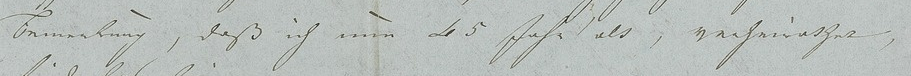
Bemerkung, daß ich nun 45 Jahr alt, verheirathet,
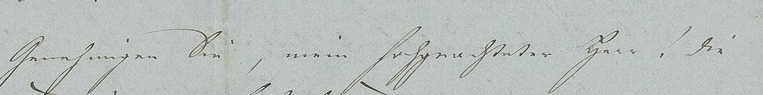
Genehmigen Sie, mein hochgeachteter Herr! die
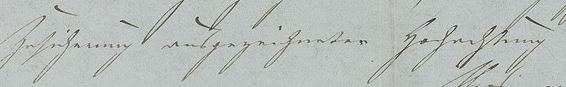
Zusicherung ausgezeichneter Hochachtung
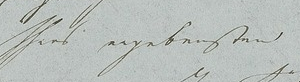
Ihres ergebensten
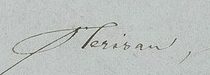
Herisau,
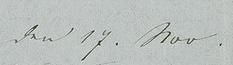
den 17. Nov.
